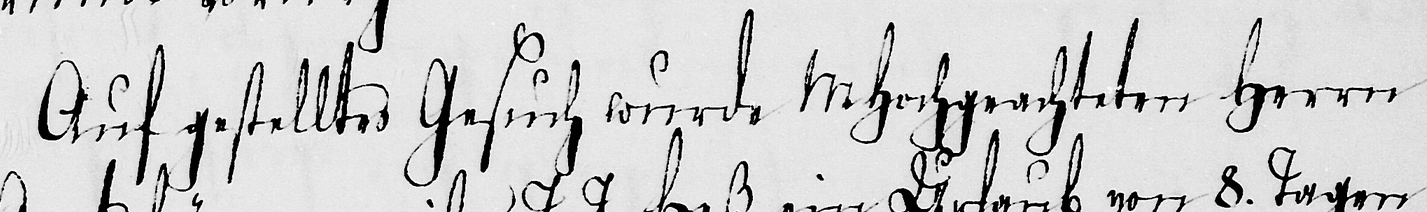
Auf gestelltes Gesuch wurde MHochgeachteten Herrn
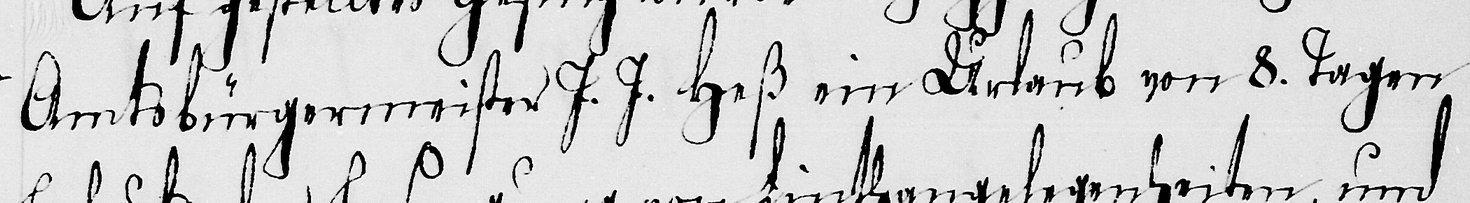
Amtsbürgermeister J. J. Heß ein Urlaub von 8. Tagen
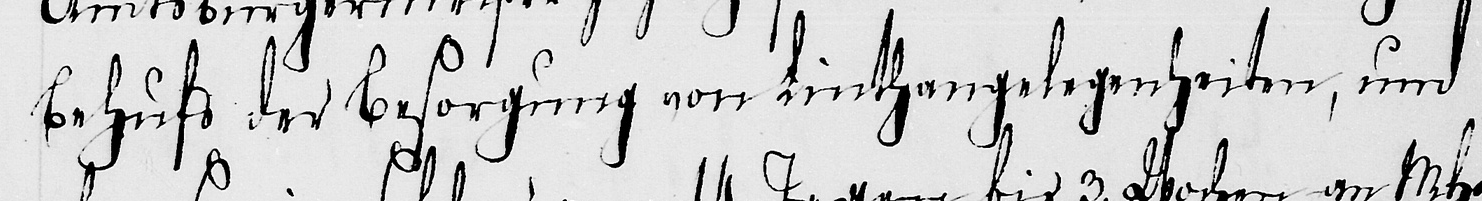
Behufs der Besorgung von Linthangelegenheiten, und
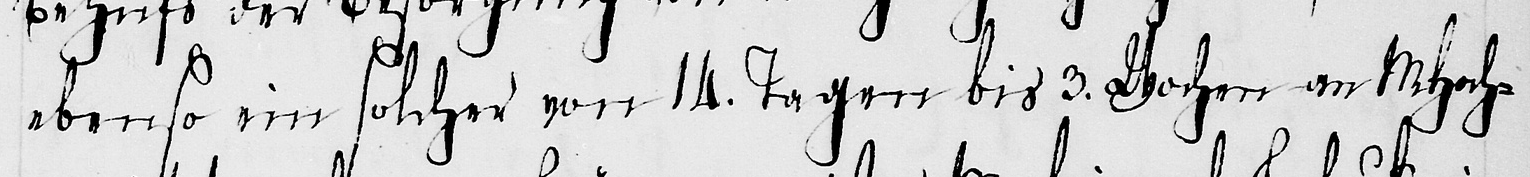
ebenso ein solcher von 14. Tagen bis 3. Wochen an MHoch¬
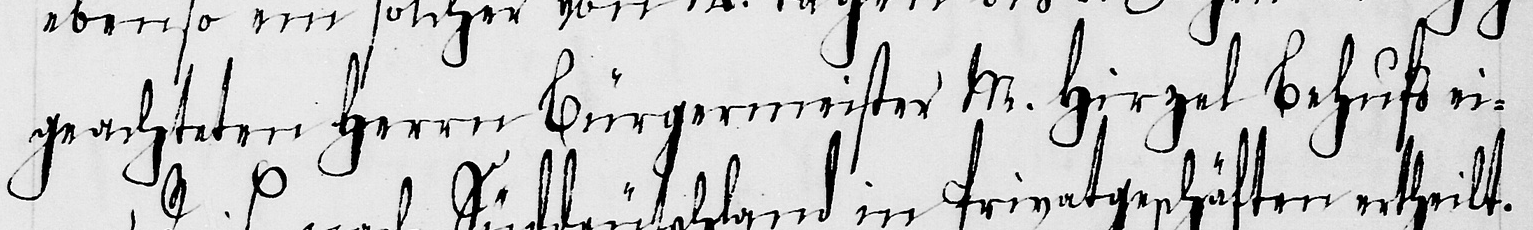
geachteten Herrn Bürgermeister M. Hirzel Behufs ei¬
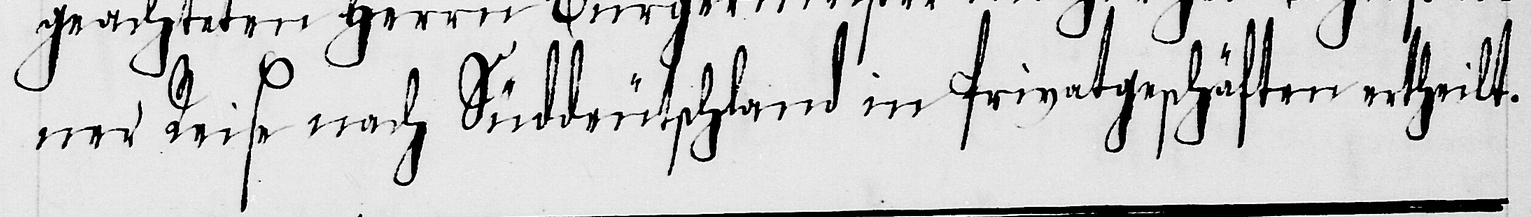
ner Reise nach Süddeutschland in Privatgeschäften ertheil¬
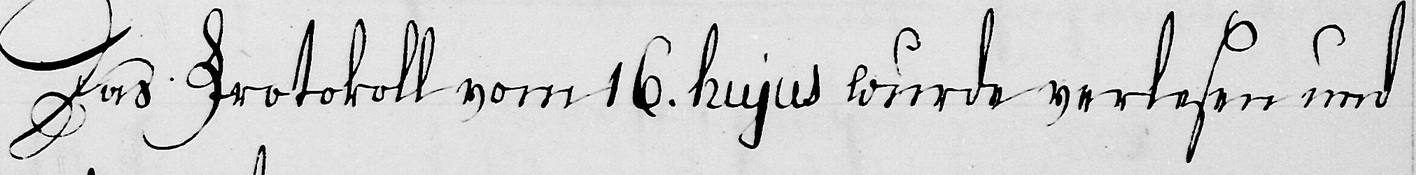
Das Protokoll vom 16. hujus wurde verlesen und
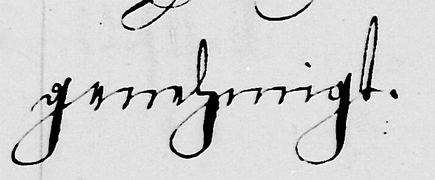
genehmigt.
